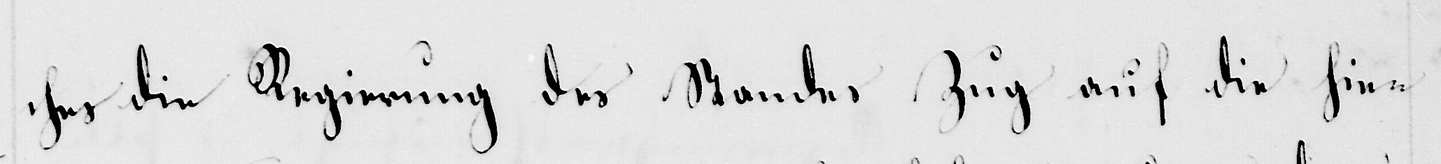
ches die Regierung des Standes Zug auf die hie¬
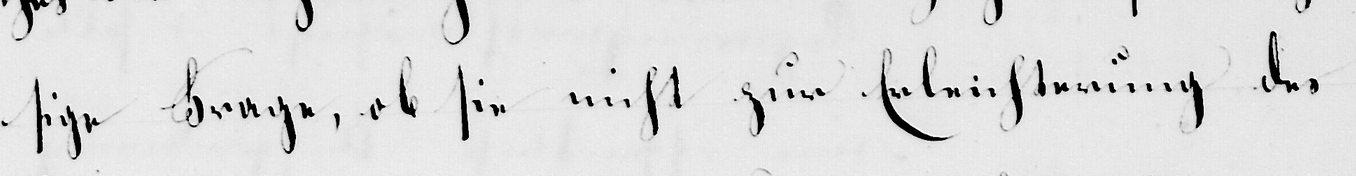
sige Frage, ob sie nicht zur Erleichterung des
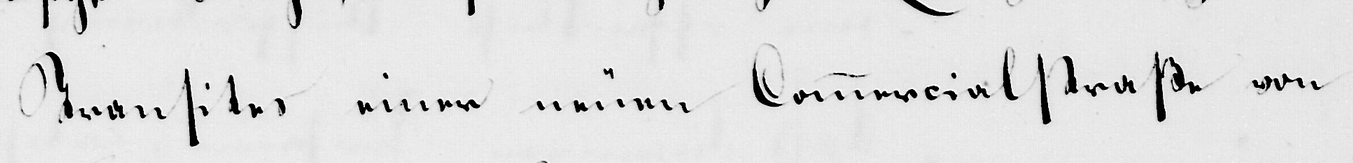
Transites einer neuen Commercialstraße von
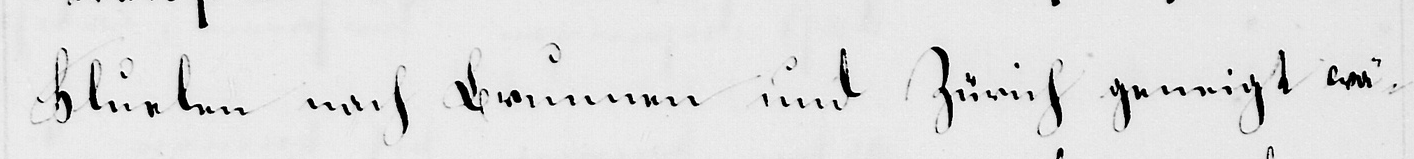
Fluelen nach Brunnen und Zürich geneigt wä¬
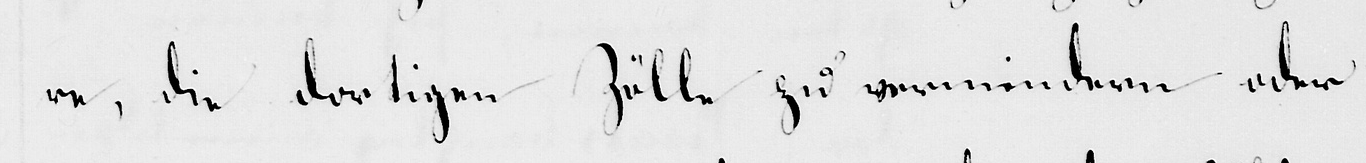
re, die dortigen Zölle zu vermindern oder
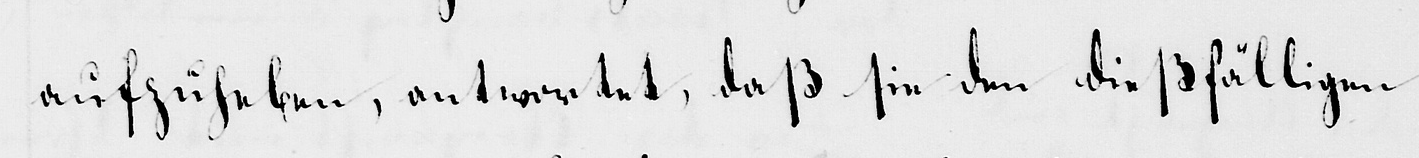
aufzuheben, antwortet, daß sie den dießfälligen
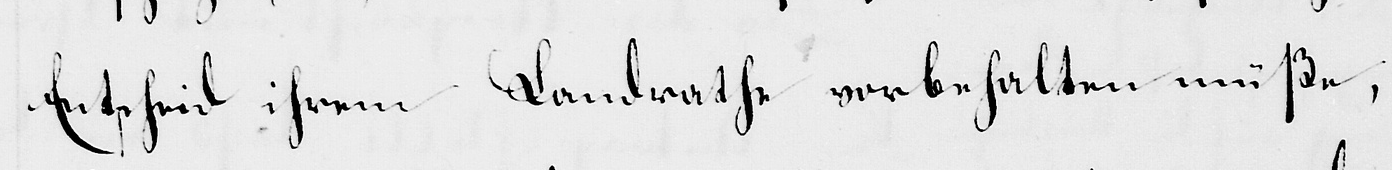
Entscheid ihrem Landrathe vorbehalten müße,
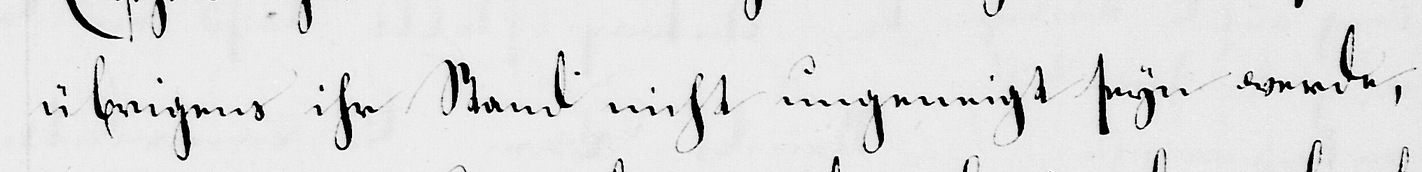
übrigens ihr Stand nicht ungeneigt seyn werde,
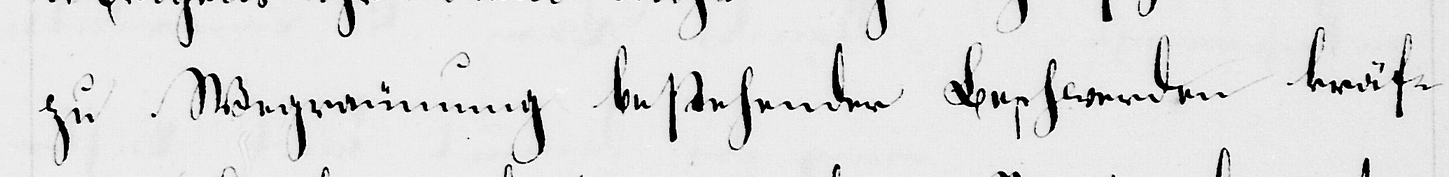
zu Wegräumung bestehender Beschwerden kräf¬
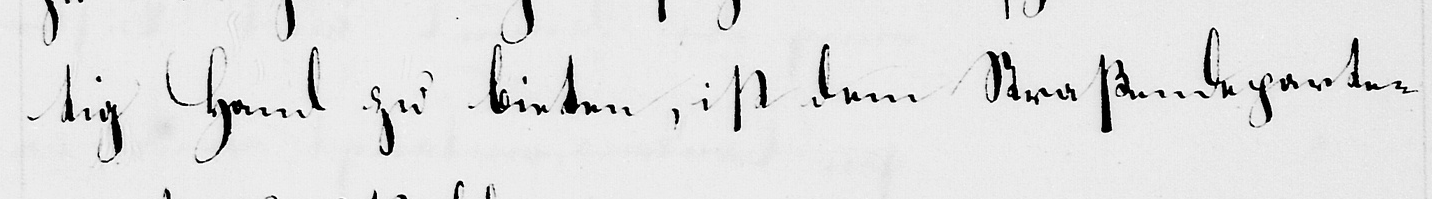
tig Hand zu bieten, ist dem Straßendeparte¬
